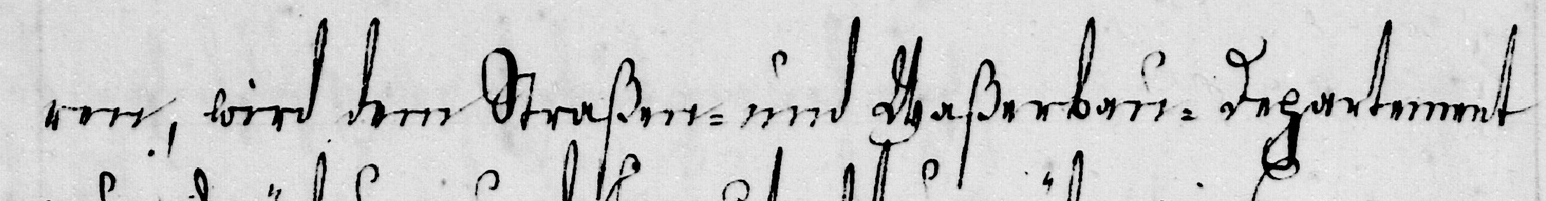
ren, wird dem Straßen- und Waßerbau-Departement
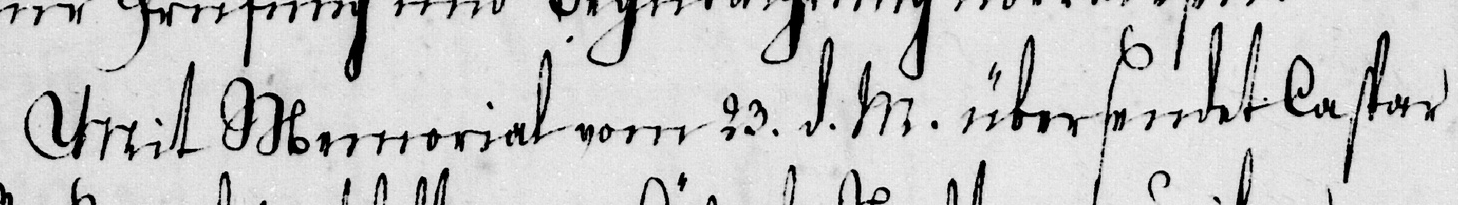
Mit Memorial vom 23. d. M. übersendet Caspar
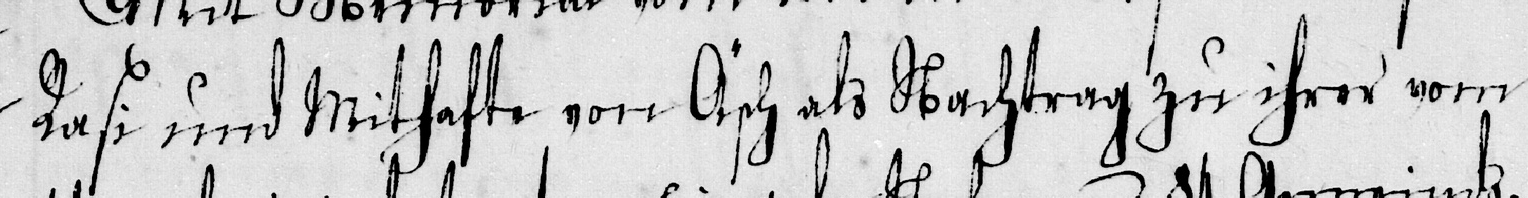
Rasi und Mithafte von Äsch als Nachtrag zu ihrer vom
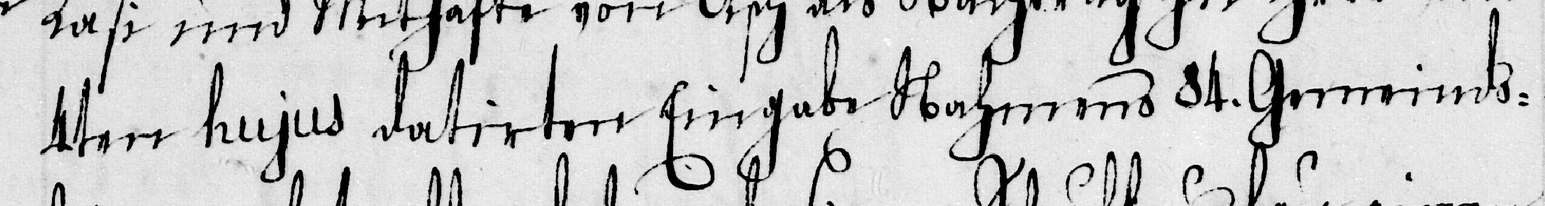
4ten hujus datirten Eingabe Nahmens 84. Gemeinds¬
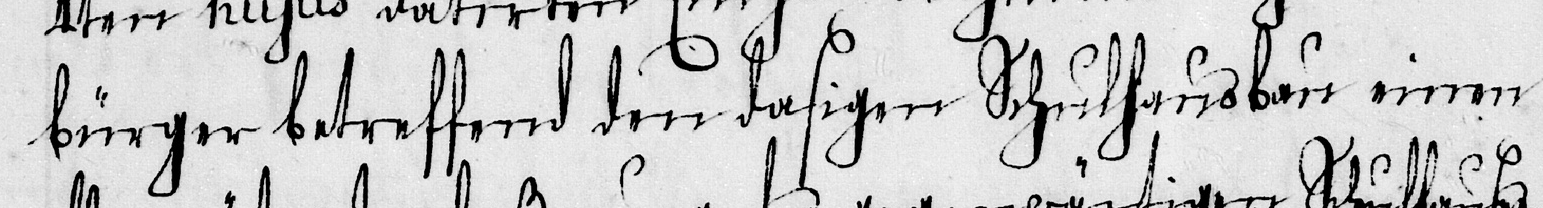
bürger betreffend den dasigen Schulhausbau einen
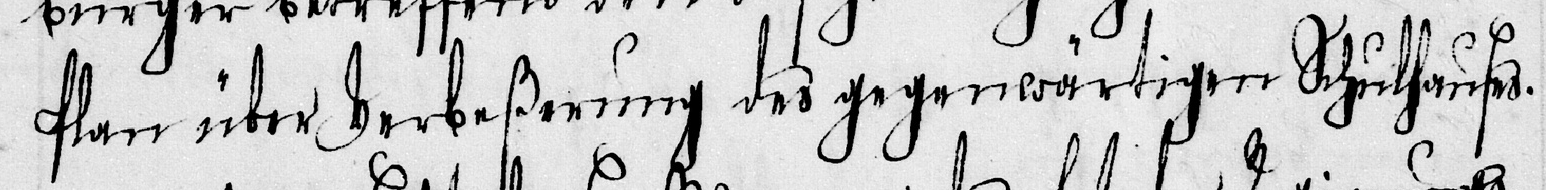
Plan über Verbeßerung des gegenwärtigen Schulhauses.
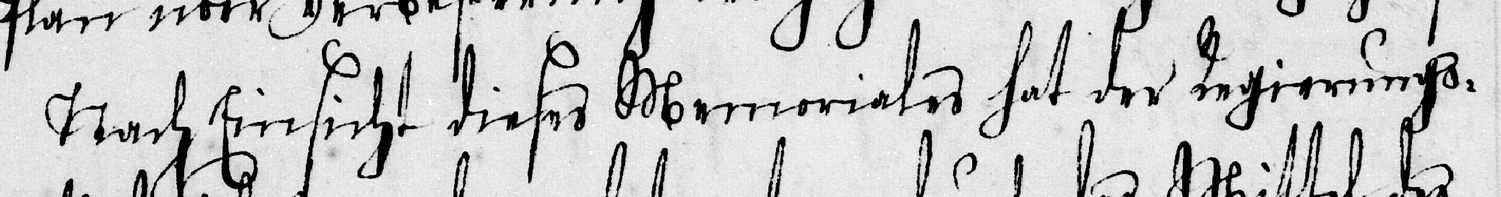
Nach Einsicht dieses Memorials hat der Regierungs¬
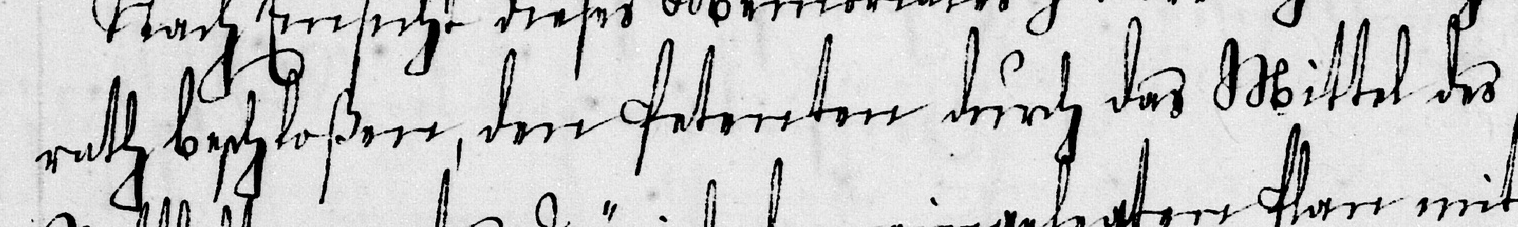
rath beschloßen, den Petenten durch das Mittel des
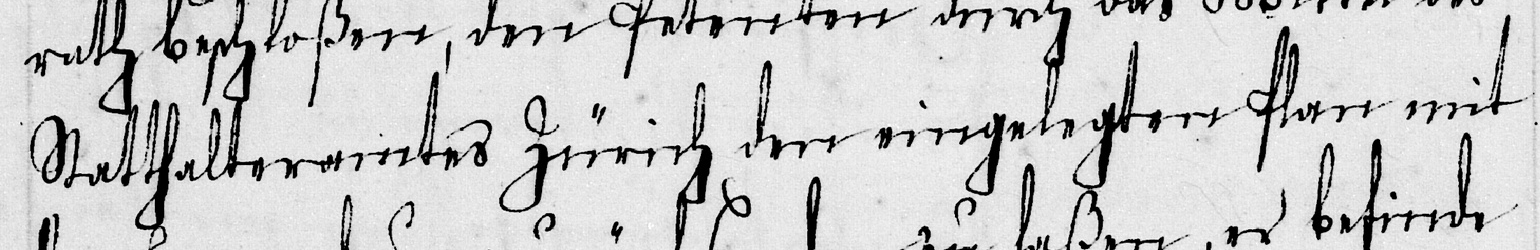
Statthalteramtes Zürich den eingelegten Plan mit
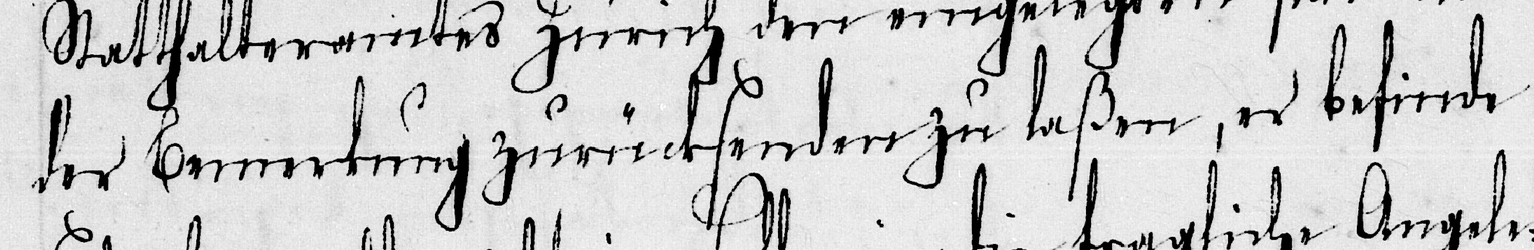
der Bemerkung zurücksenden zu laßen, er befinde
